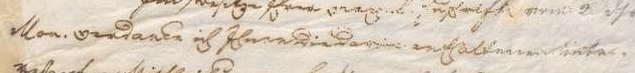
Mon. verdanke ich Ihnen die darin enthaltenen inte-
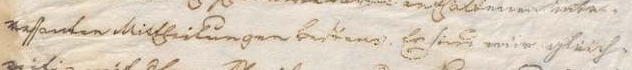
ressanten Mittheilungen bestens. Es sind mir gleich-
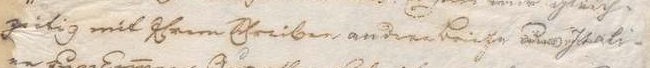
zeitig mit Ihrem Schreiben andere Briefe aus Itali-
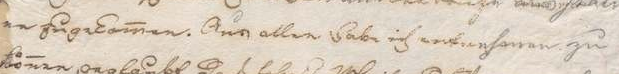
en zu gekommen. Aus allen habe ich entnehmen zu
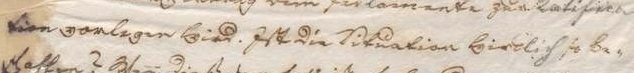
tion vorlegen wird. Ist die Situation wirklich so be-
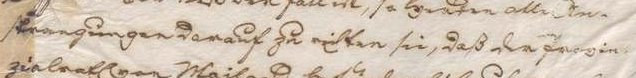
strengungen darauf zu richten sei, daß der Provin-
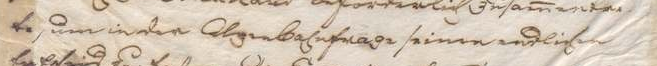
te, um in der Alpenbahnfrage seinen endlichen
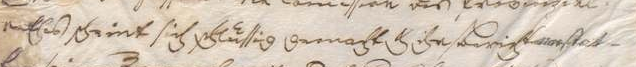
rathes scheint sich schlüssig gemacht & ihr Berichterstat-
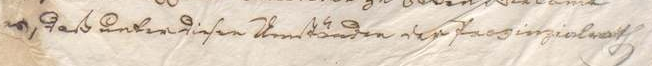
es, daß unter diesen Umständen der Provinzialrath
